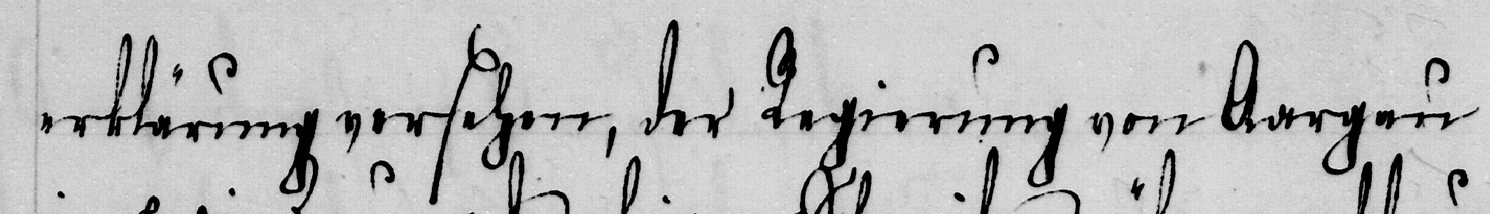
erklärung versehen, der Regierung von Aargau
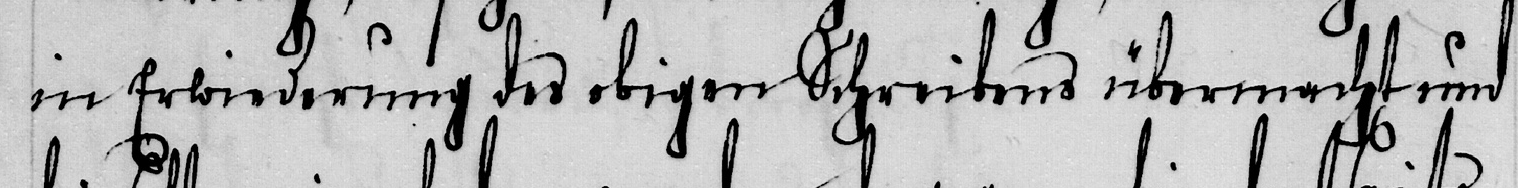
in Erwiederung des obigen Schreibens übermacht und
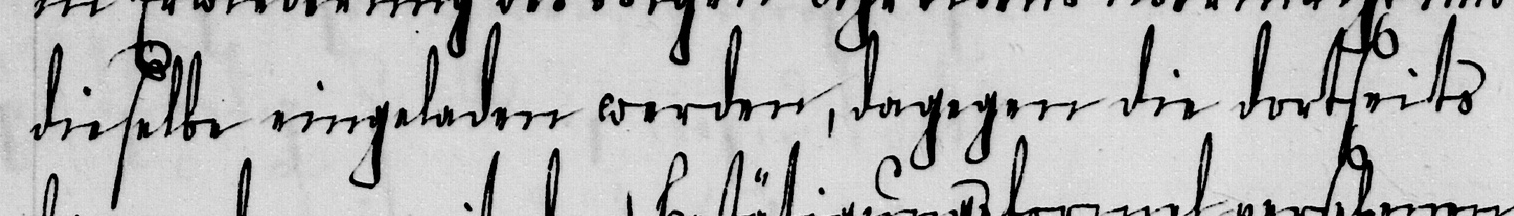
dieselbe eingeladen werden, dagegen die dortseits
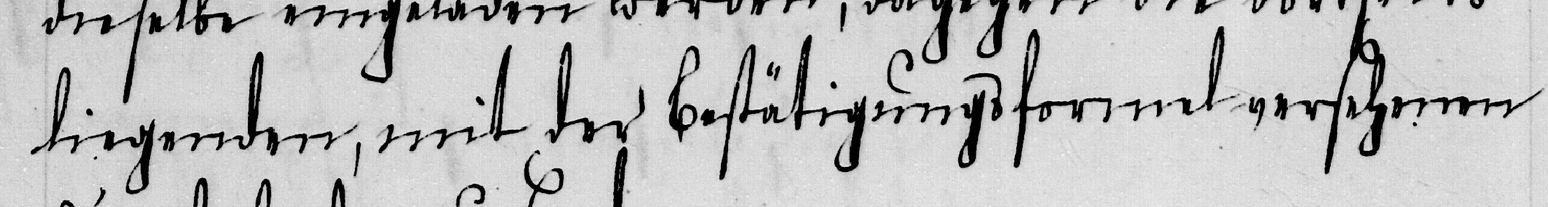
liegenden, mit der Bestätigungsformel versehenen
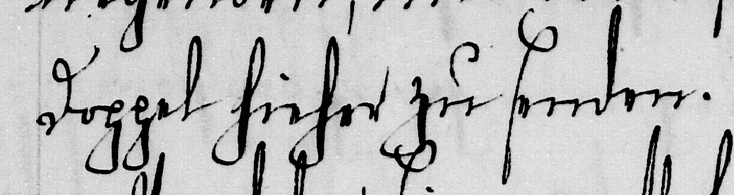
Doppel hieher zu senden.
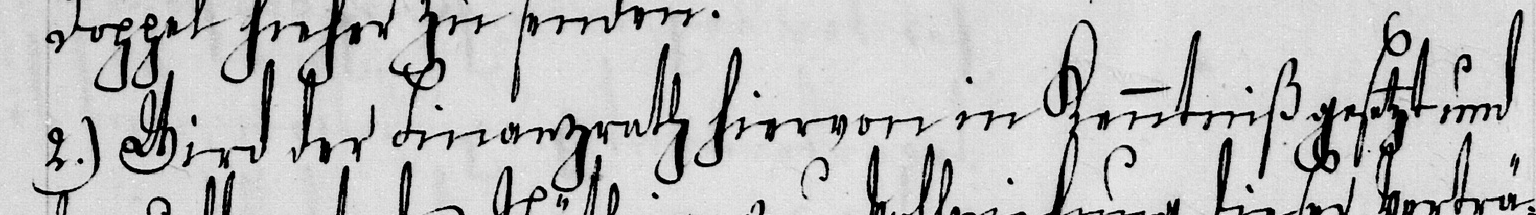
2.) Wird der Finanzrath hiervon in Kenntniß gesetzt und
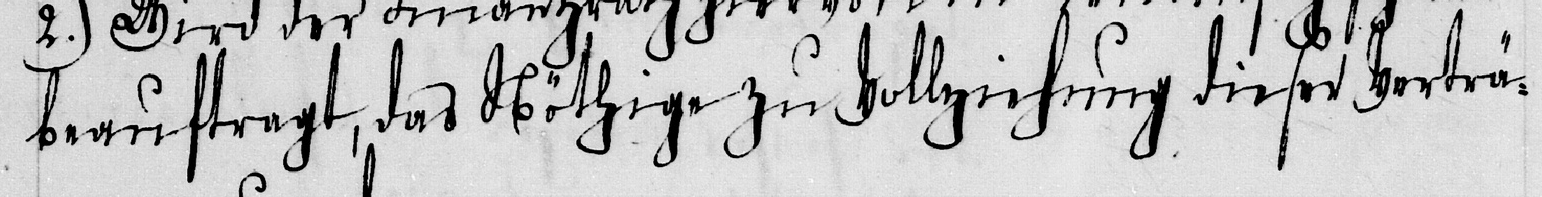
beauftragt, das Nöthige zu Vollziehung dieser Verträ¬
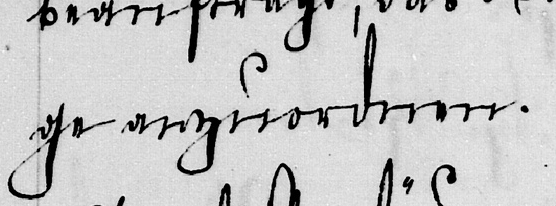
ge anzuordnen.
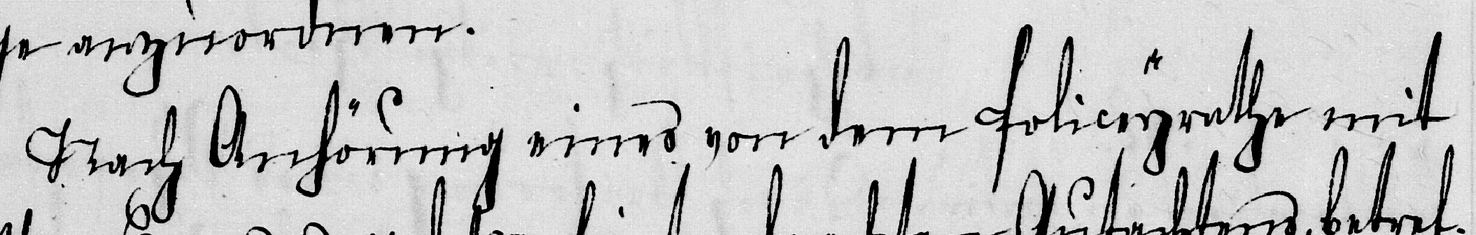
Nach Anhörung eines von dem Policeyrathe mit
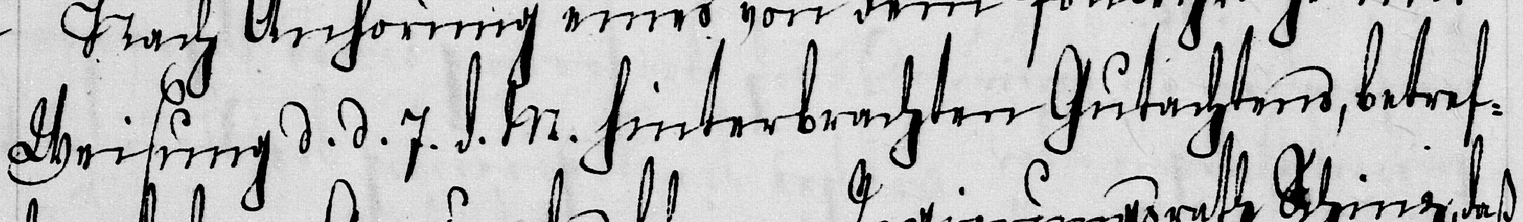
Weisung d. d. 7. d. M. hinterbrachten Gutachtens, betref¬
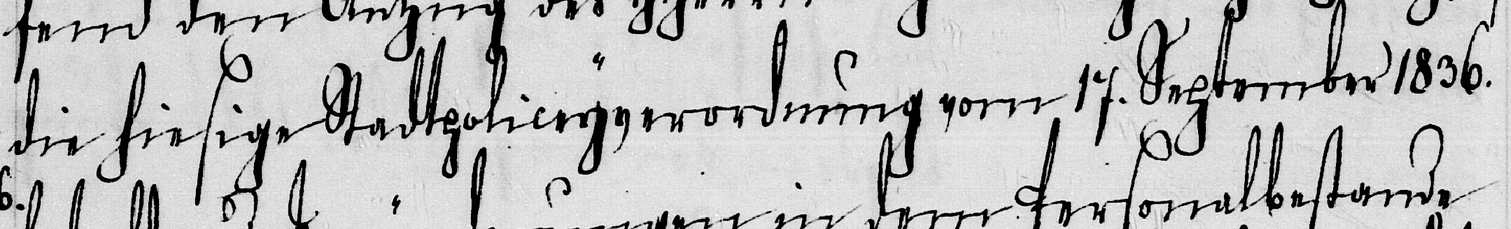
die hiesige Stadtpoliceyverordnung vom 17. September 1836.
